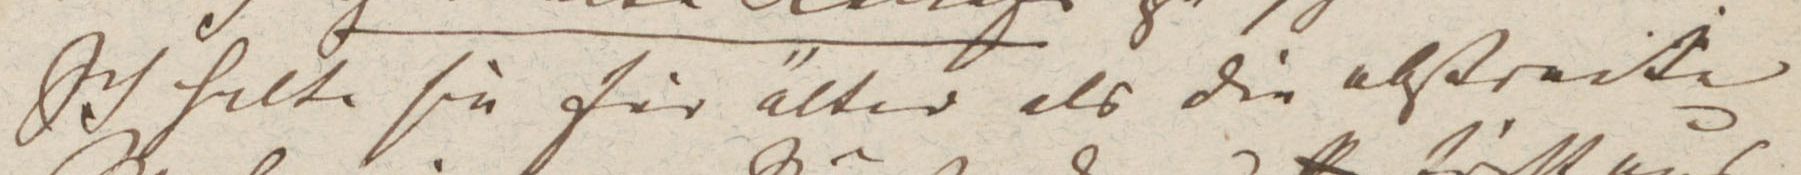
Ich halte sie für älter als die abstracte
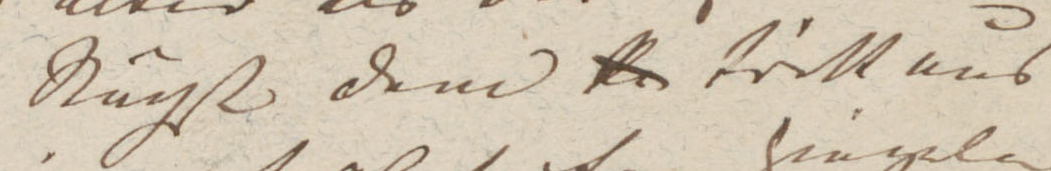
Nächst dem k tritt uns
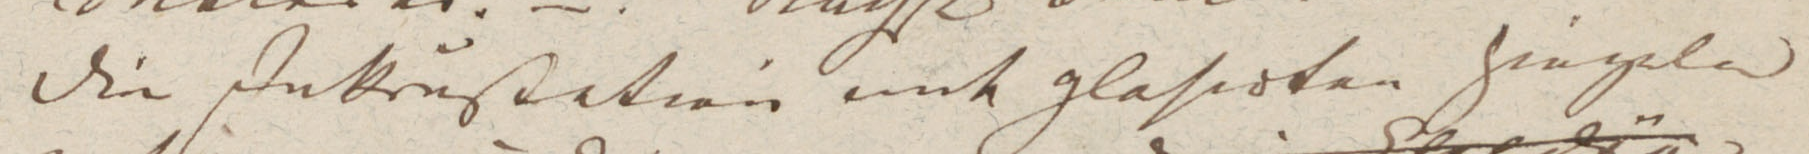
die Inkrustation mit glasirten Ziegeln
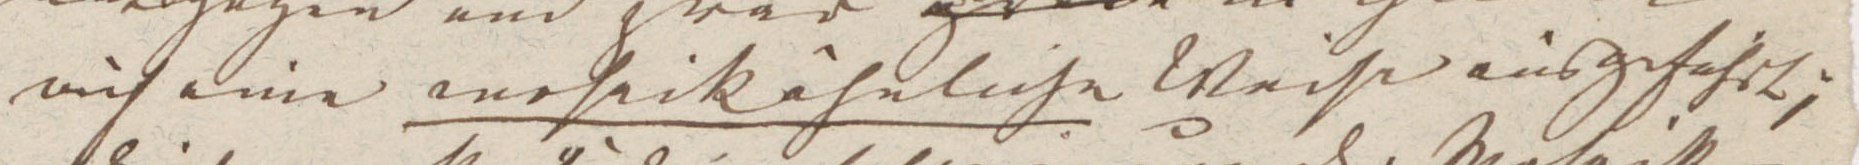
auf eine mosaikähnliche Weise ausgeführt;
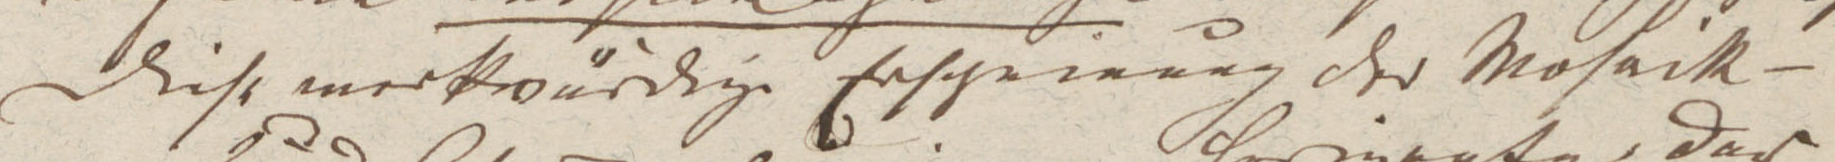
Diese merkwürdige Erscheinung der Mosaik-
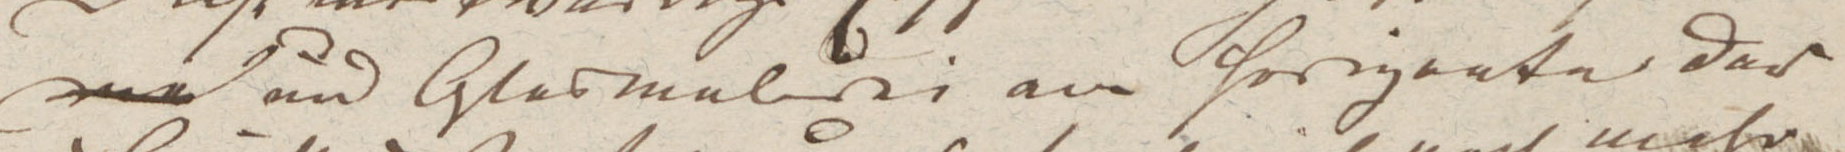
ma und Glasmalerei am Horizonte der
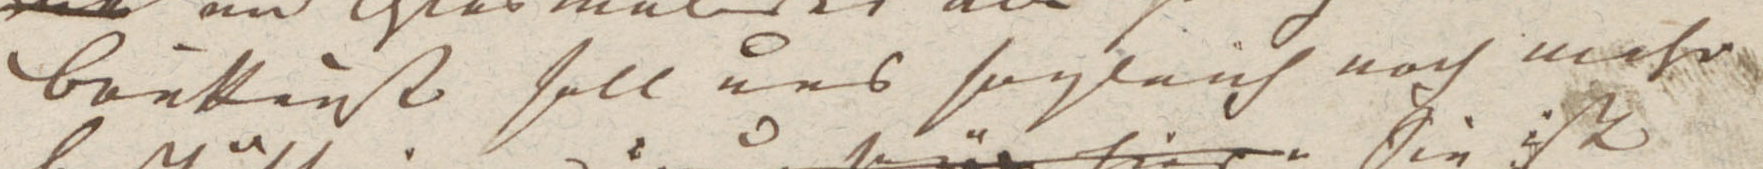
Baukunst soll uns sogleich noch mehr
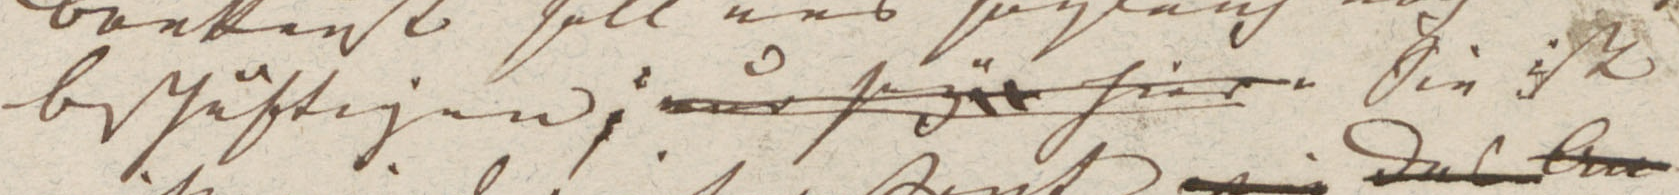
beschäftigen; nur seyen hier Sie ist
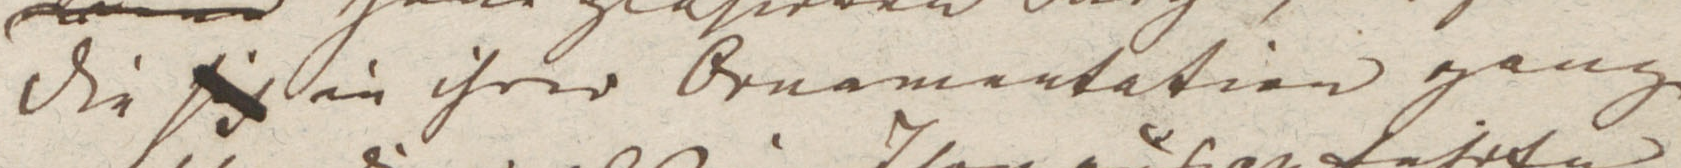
die sich in ihrer Ornamentation ganz
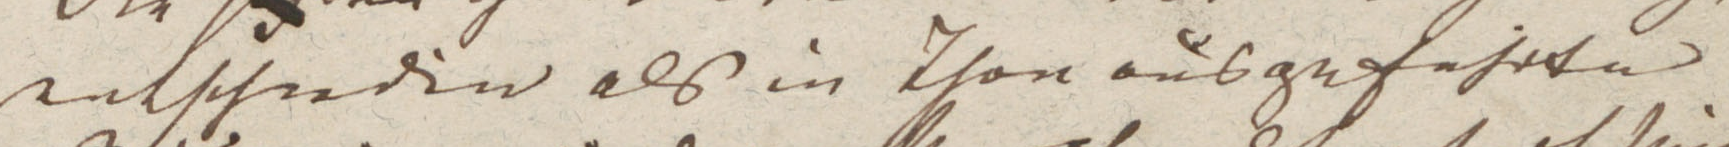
entschieden als in Thon ausgeführte
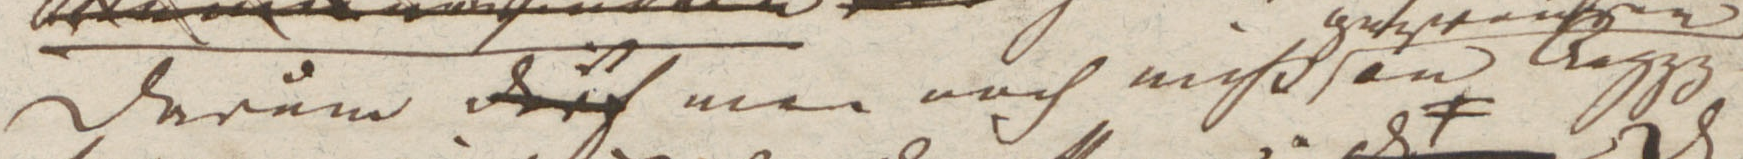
Darum darf ist man noch nicht gezwungen an Aegyp-
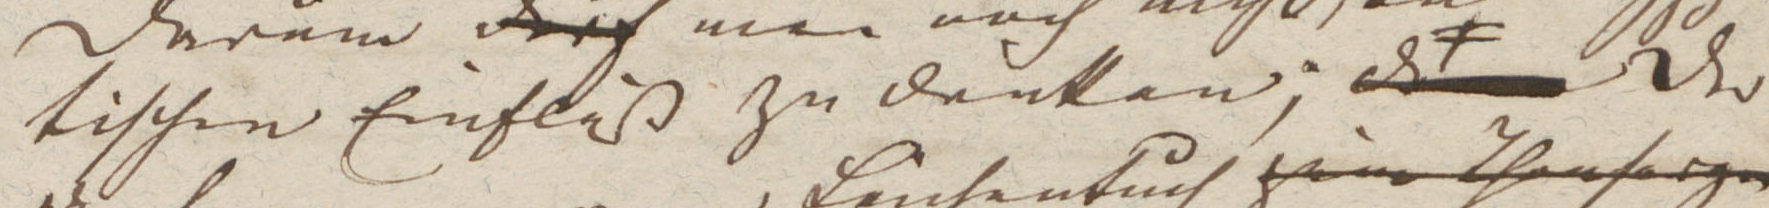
tischen Einfluss zu denken; d % Der
